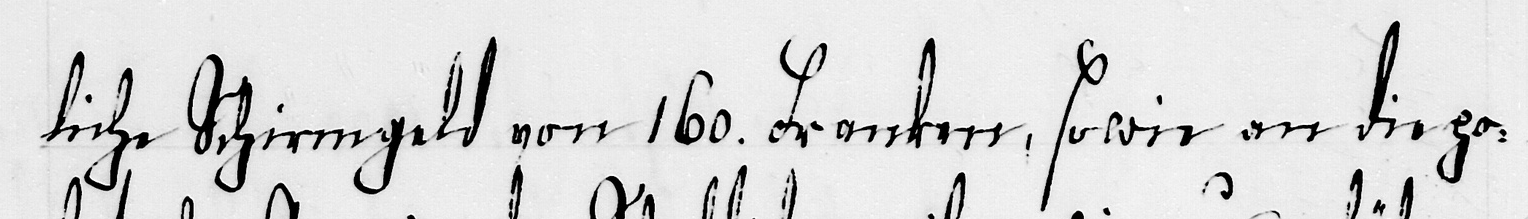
liche Schirmgeld von 160. Franken, sowie an die po¬
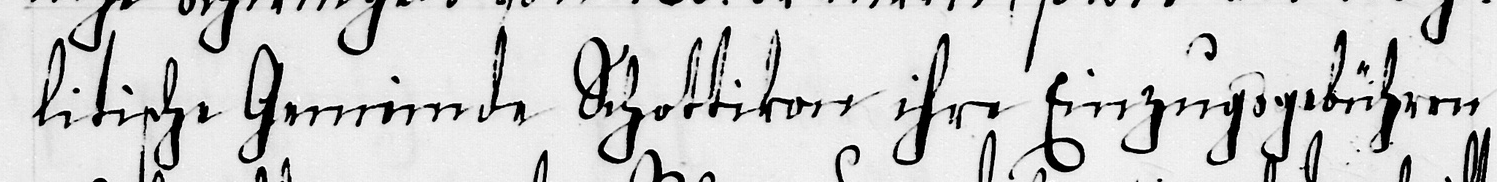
litische Gemeinde Schottikon ihre Einzugsgebühren
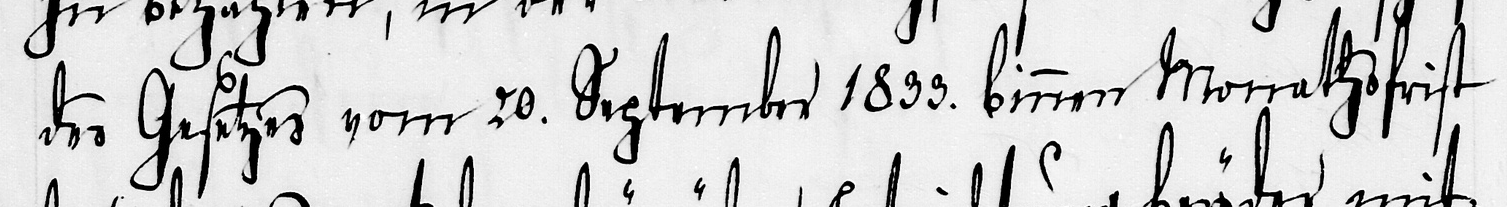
des Gesetzes vom 20. September 1833. binnen Monathsfrist
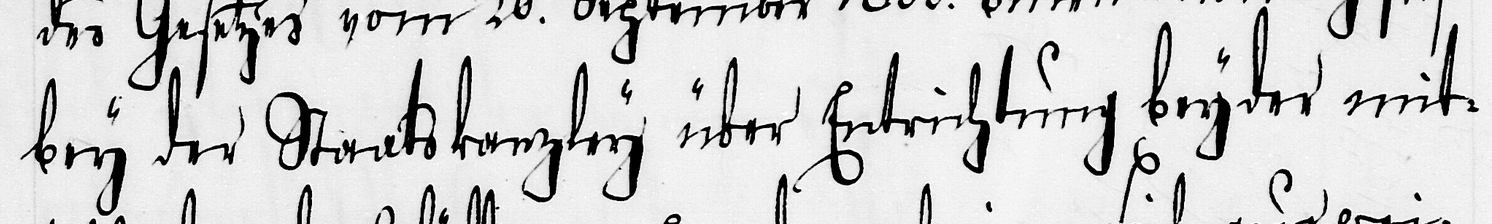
bey der Staatskanzley über Entrichtung beyder mit¬
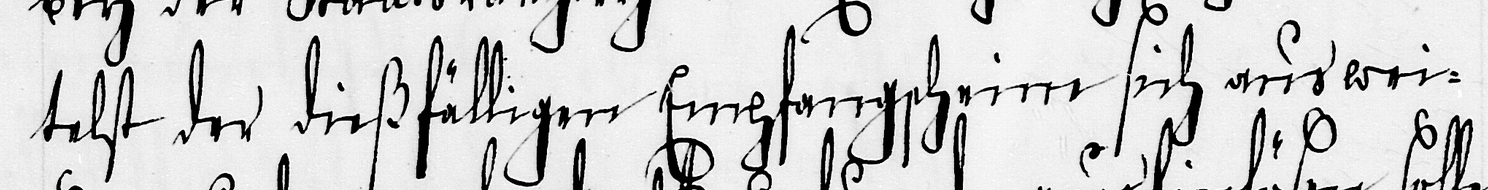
telst der dießfälligen Empfangscheine sich auswei¬
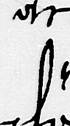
t.
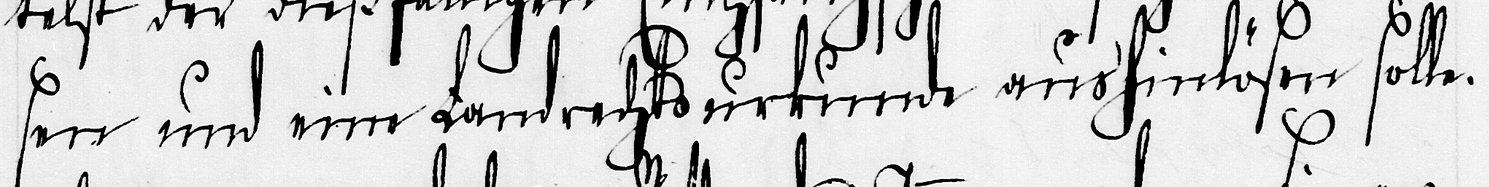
sen und eine Landrechtsurkunde aushinlösen solle.
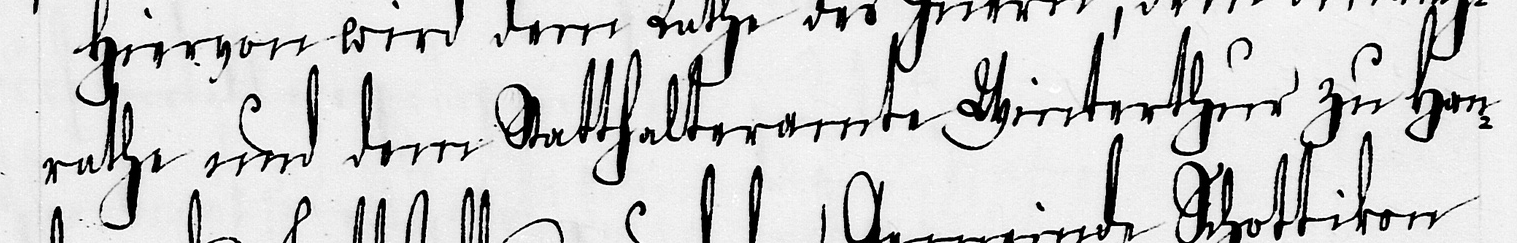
rathe und dem Statthalteramte Winterthur zu Han¬
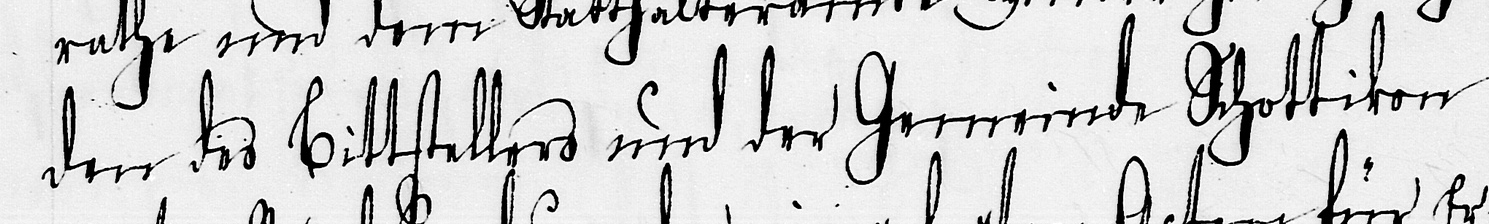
den des Bittstellers und der Gemeinde Schottikon
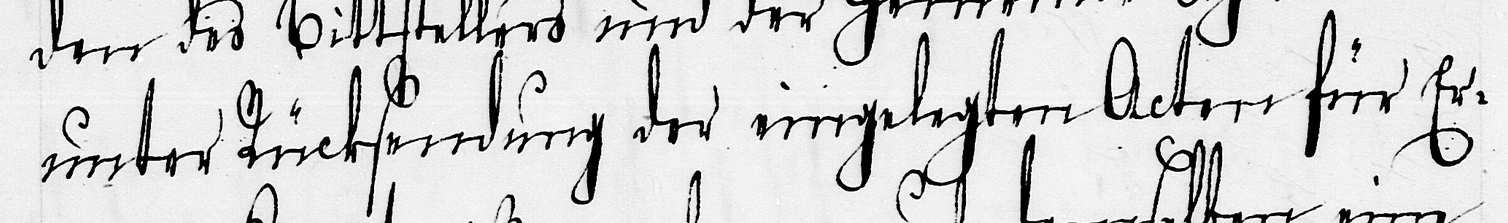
unter Rücksendung der eingelegten Acten für Er¬
